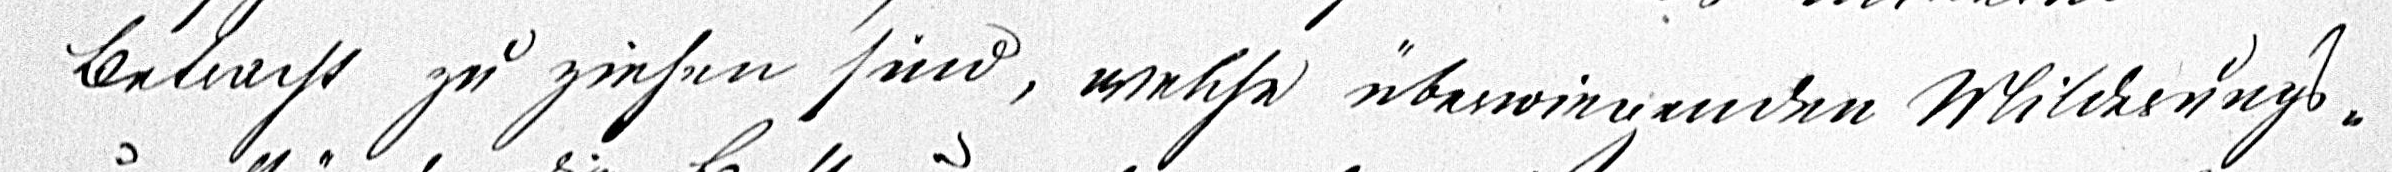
Betracht zu ziehen sind, welche überwiegnenden Milderungs¬
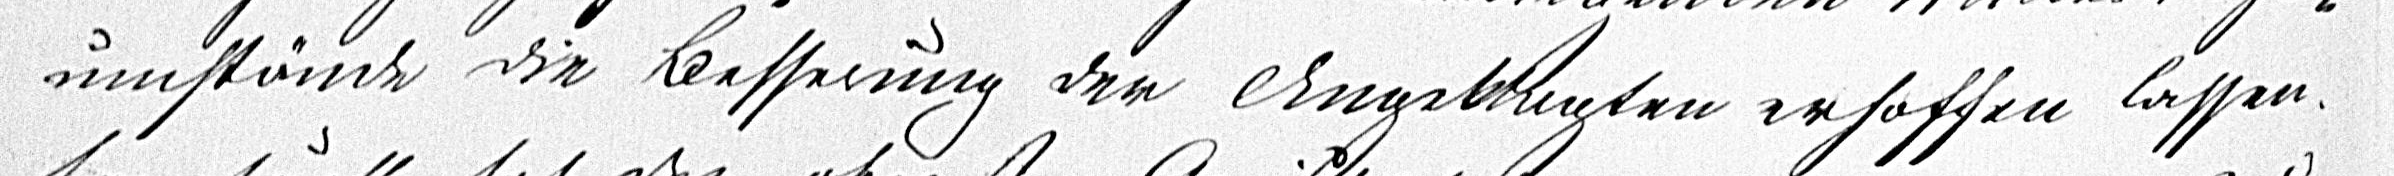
umstände die Besserung der Angeklagten erhoffen lassen.
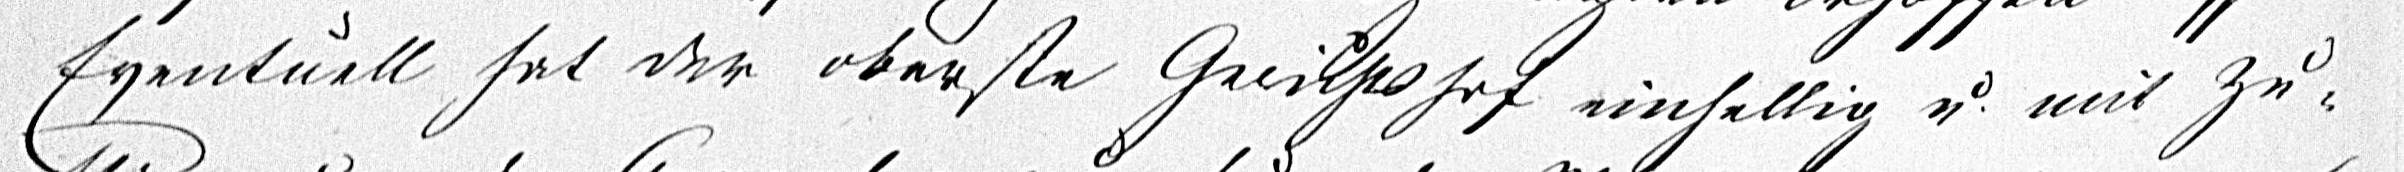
Eventuell hat der oberste Gerichtshof einhellig u. mit Zu¬
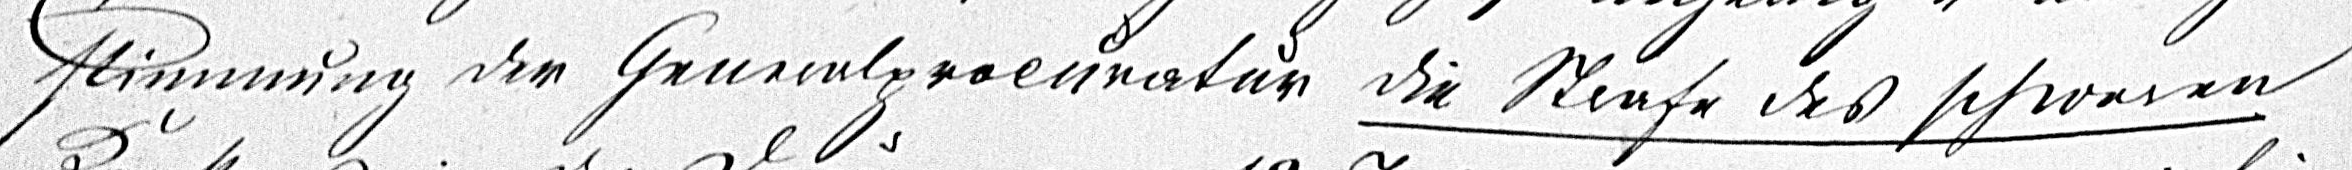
stimmung der Generalprocuratur die Strafe des schweren
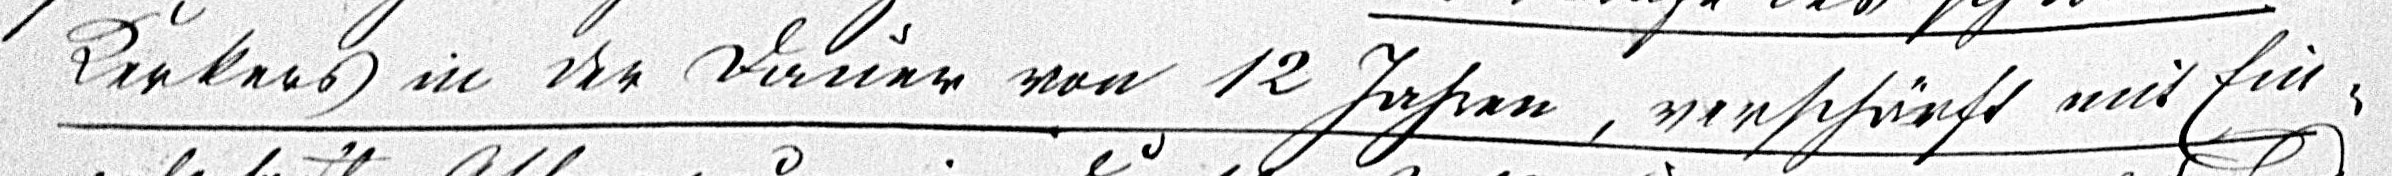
Kerkers in der Dauer von 12 Jahren, verschärft mit Ein¬
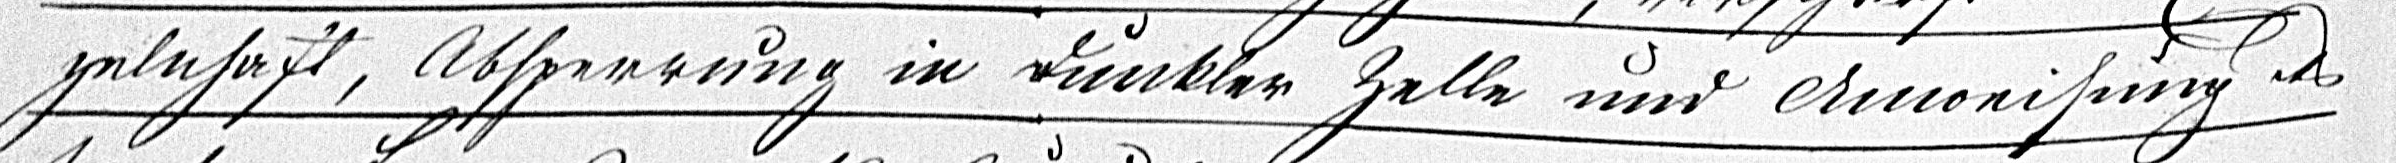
zelnhaft, Absperrung in Dunkler Zelle und Anweisung des
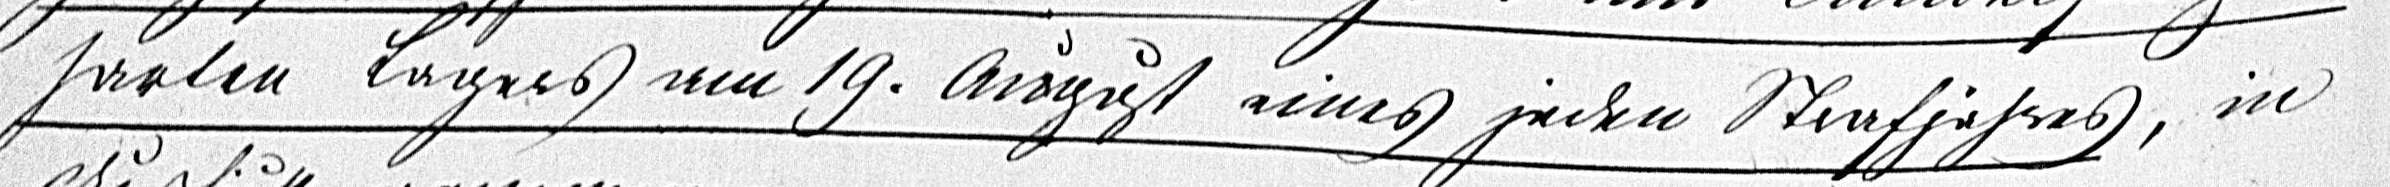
harten Lagers am 19. August eines jeden Strafjahres, in
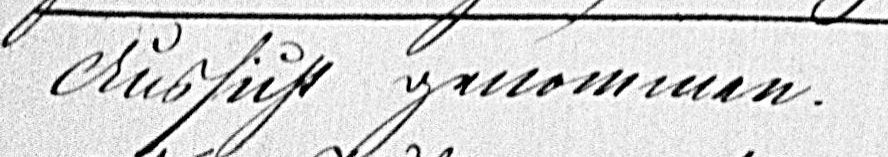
Aussicht genommen.
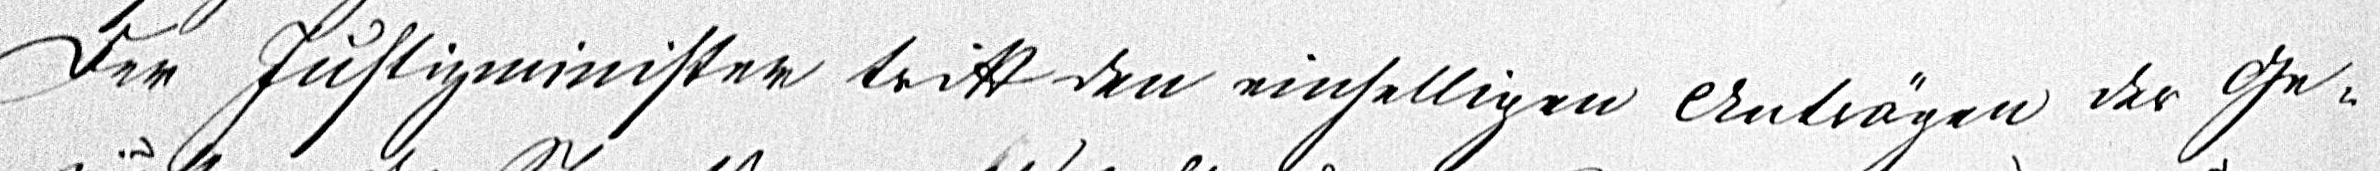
Der Justizminister tritt den einhelligen Anträgen der Ge¬
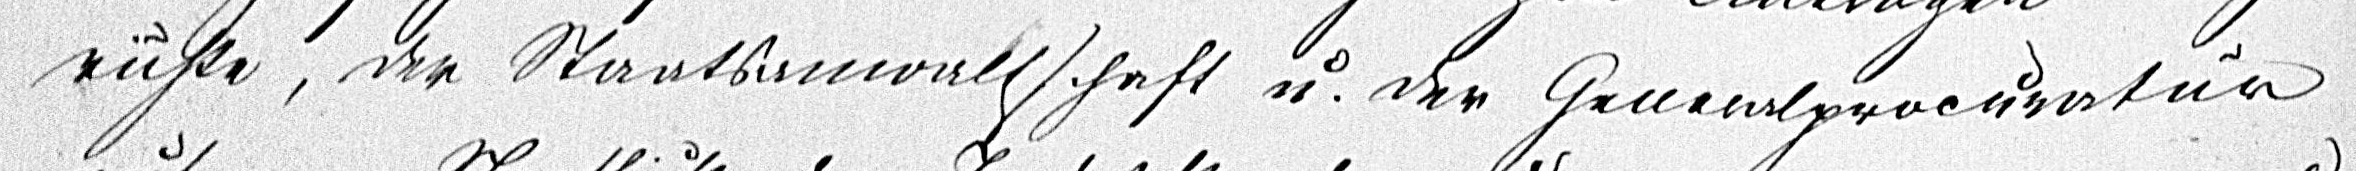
ruhte, der Staatsanwaltschaft u. der Generalprocuratur
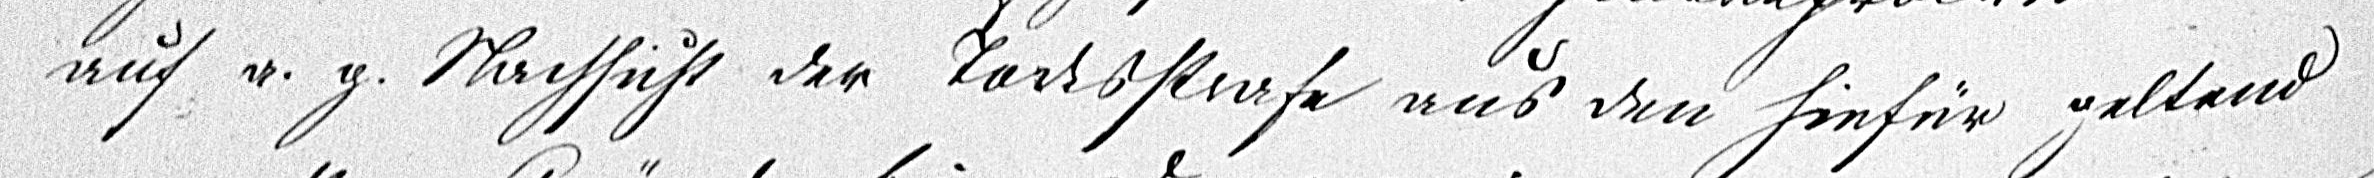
auf a. g. Nachsicht der Todesstrafe aus den hiefür geltend
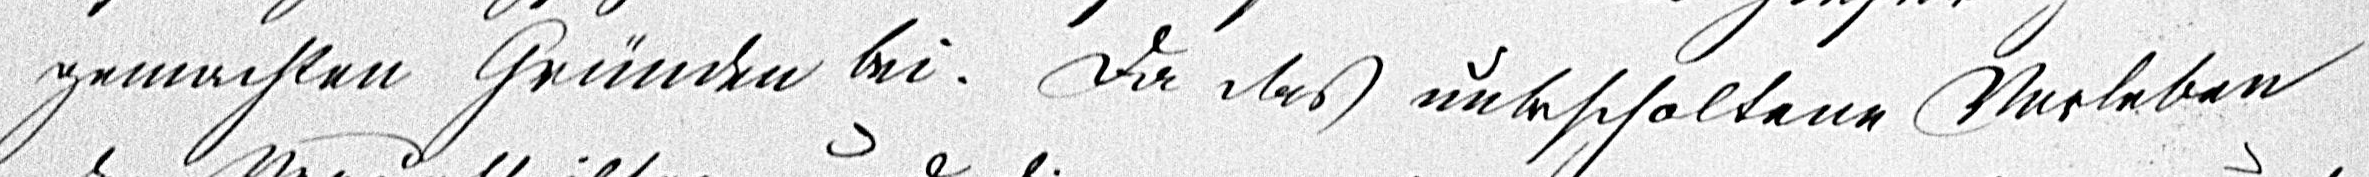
gemachten Gründen bei. Da das unbescholtene Verleben
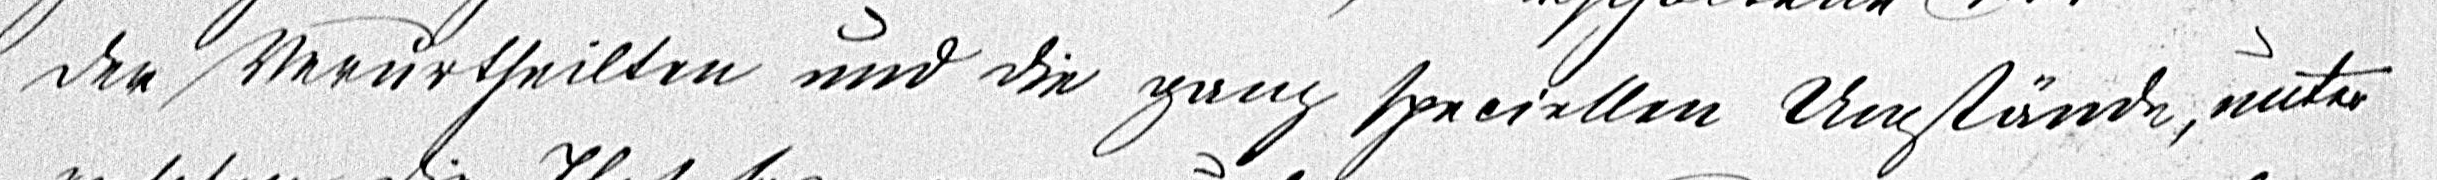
der Verurtheilten und die ganz speciellen Umstände, unter
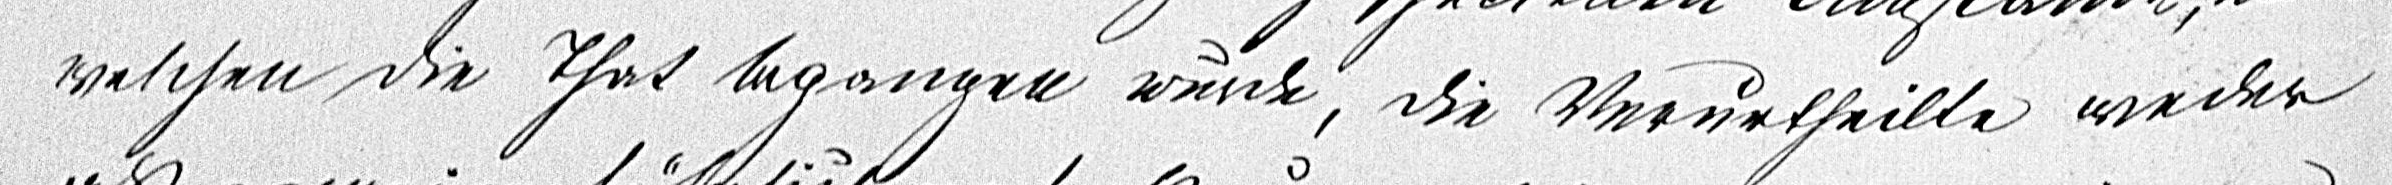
welchen die That begangen wurde, die Verurtheilte weder
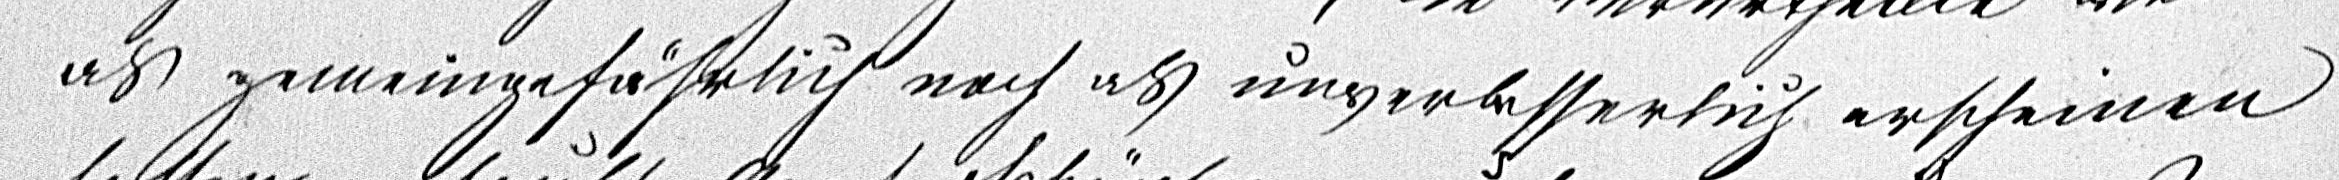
als gemeingefährlich noch als unverbesserlich erscheinen
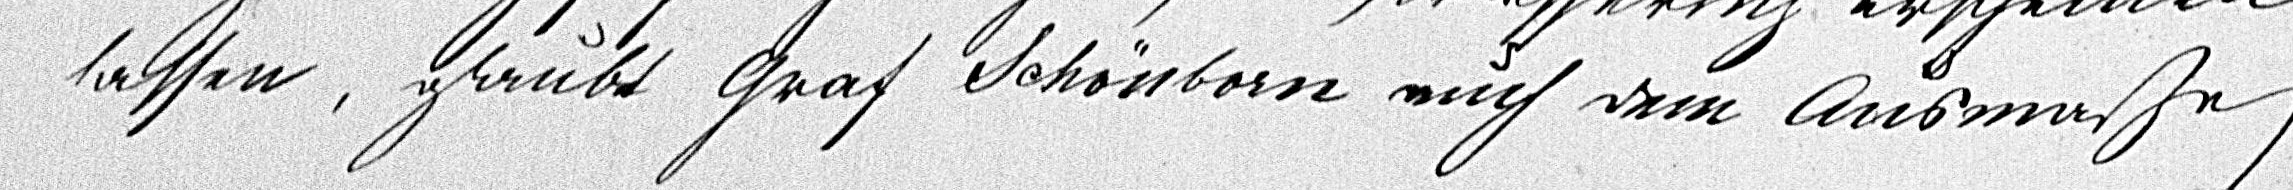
lassen, glaubt Graf Schönborn auch dem Ausmaße
